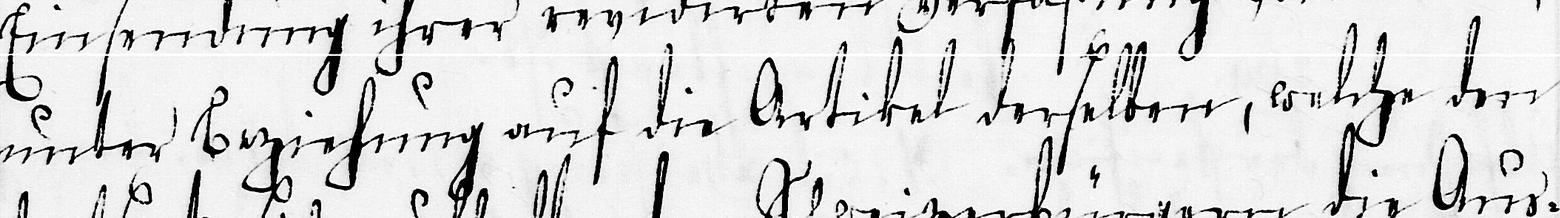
unter Beziehung auf die Artikel derselben, welche den
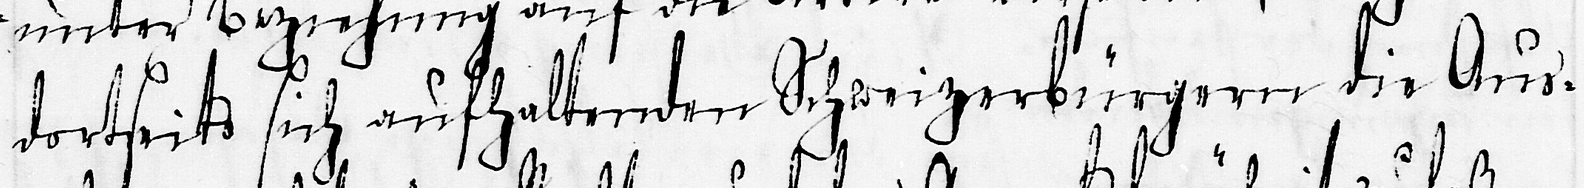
dortseits sich aufhaltenden Schweizerbürgern die Aus¬
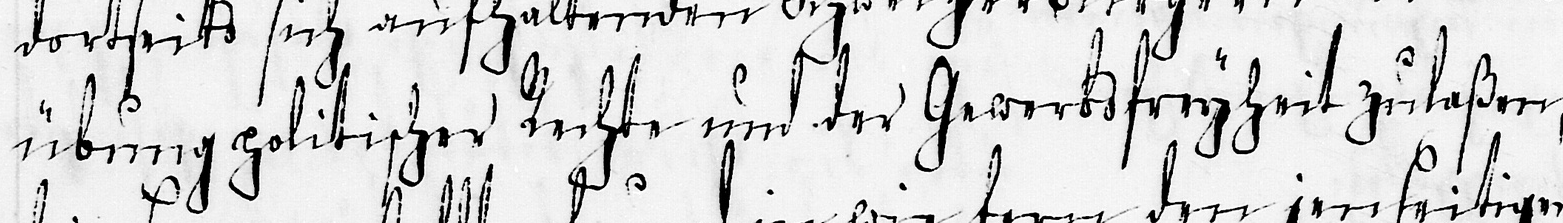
übung politischer Rechte und der Gewerbsfreyheit zulaßen,
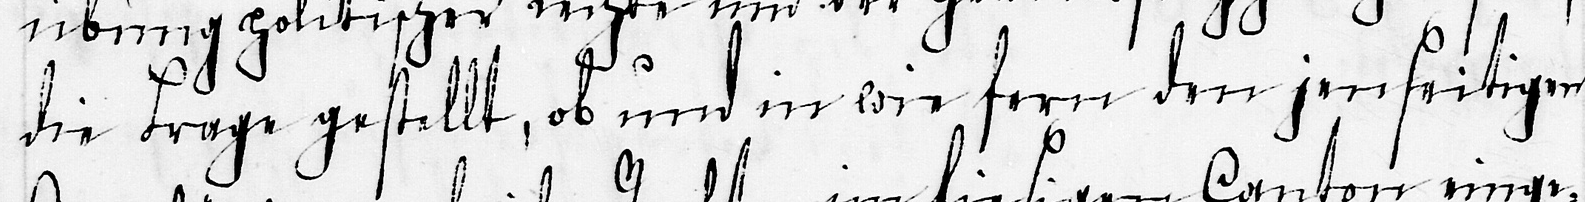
die Frage gestellt, ob und in wie fern den jenseitigen
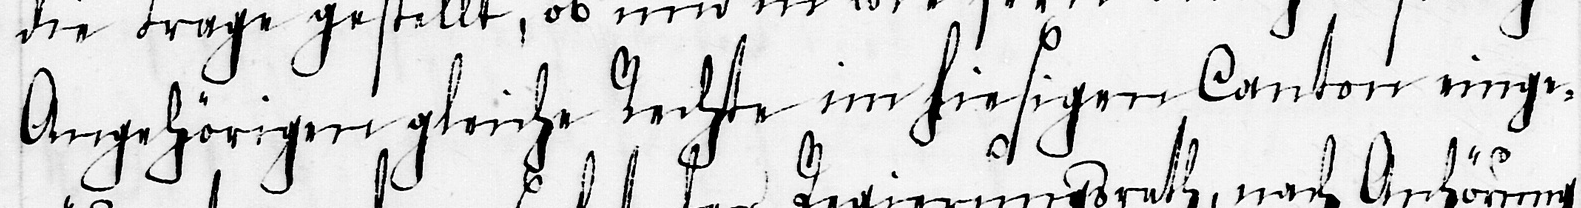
Angehörigen gleiche Rechte im hiesigen Canton einge¬
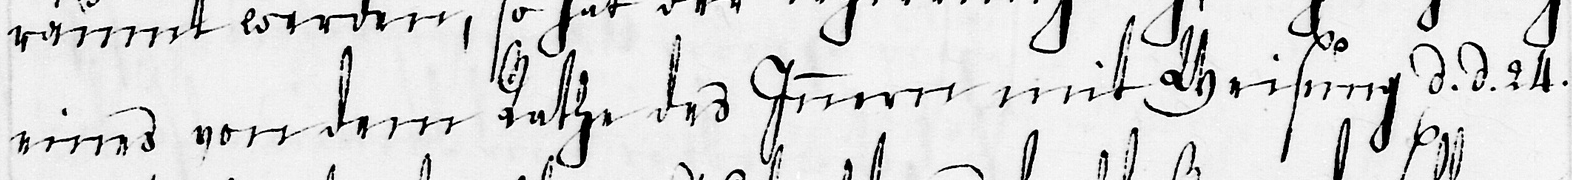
eines von dem Rathe des Innern mit Weisung d. d. 24.
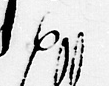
d. M.
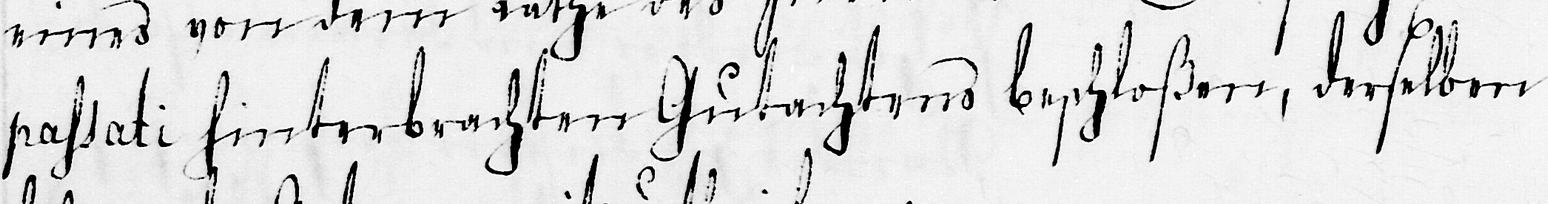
passati hinterbrachten Gutachtens beschloßen, derselben
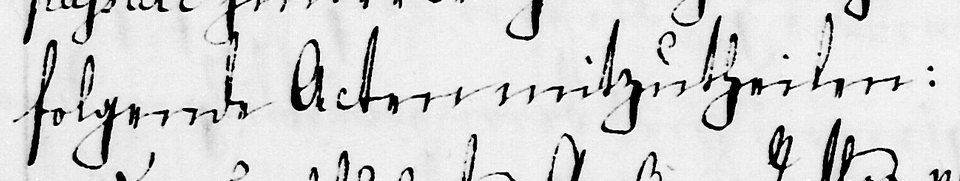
folgende Acten mitzutheilen:
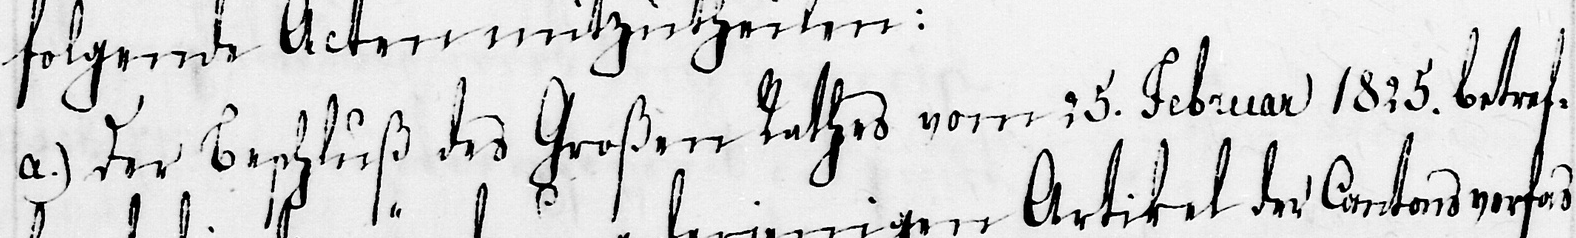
a.) Der Beschluß des Großen Rathes vom 25. Februar 1825. betref¬
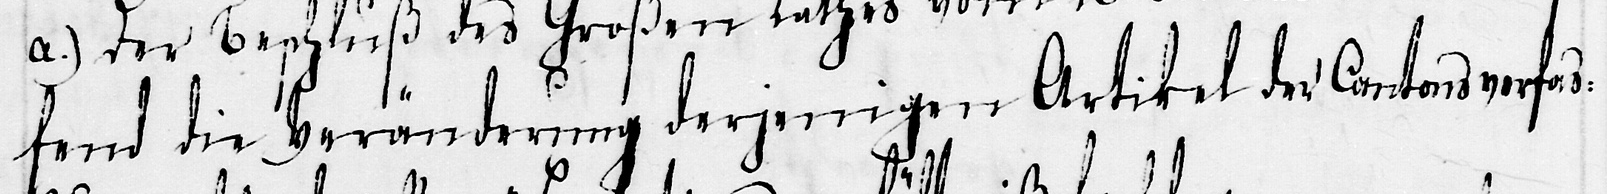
fend die Veränderung derjenigen Artikel der Cantonsverfaß¬
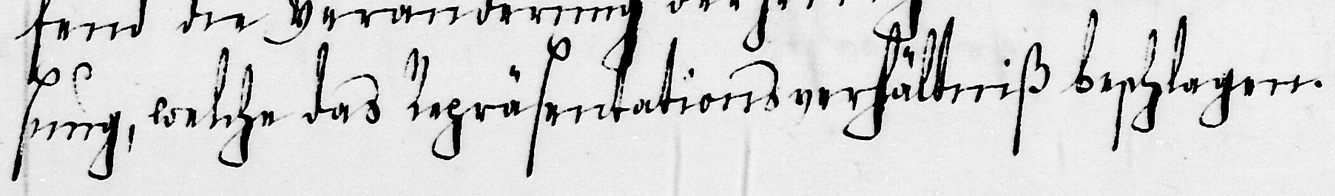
ung, welche das Repräsentationsverhältniß beschlagen.
